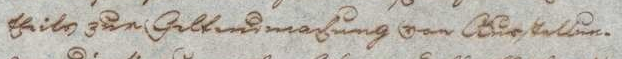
theils zur Geltendmachung von Ausstellun-
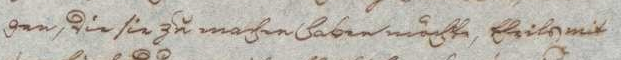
gen, die sie zu machen haben möchte, theils mit
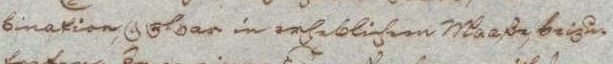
bination, & zwar in erheblichem Maaße, beizu-
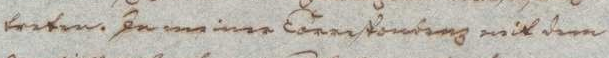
treten. In meiner Correspondenz mit dem
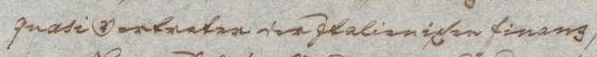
quasi Vertreter der Italienischen Finanz,
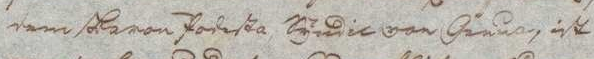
dem Baron Podesta, Syndic von Genua, ist
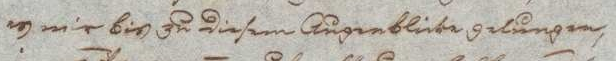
es mir bis zu diesem Augenblicke gelungen,
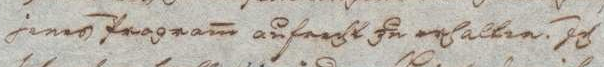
jenes Programm aufrecht zu erhalten. Ich
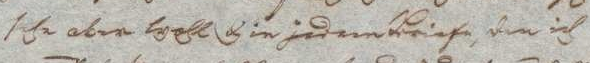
sehe aber wohl & in jedem Briefe, den ich
